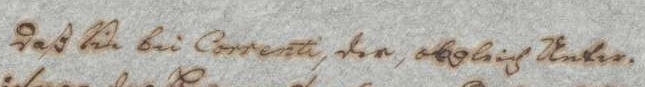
Daß sie bei Correnti, der, obgleich Unter-
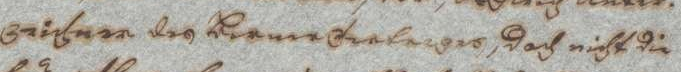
zeichner des Bernervertrages, doch nicht die
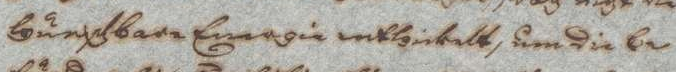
wünschbare Energie entwickelt, um die be-
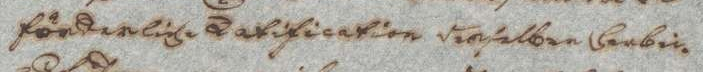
förderliche Ratification desselben herbei-
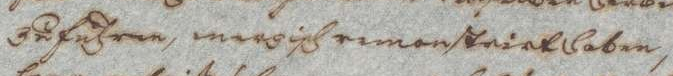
zuführen, energisch remonstrirt haben,
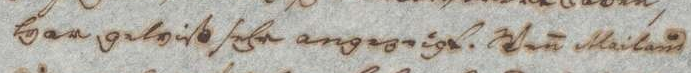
war gewiß sehr angezeigt. Wenn Mailand
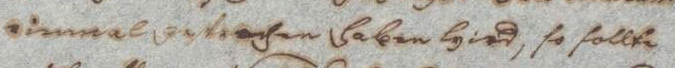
einmal gesprochen haben wird, so sollte
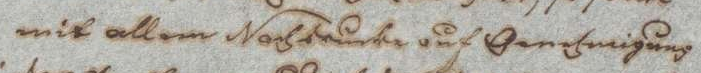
mit allem Nachdrucke auf Genehmigung
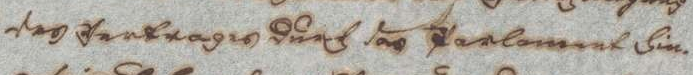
des Vertrages durch das Parlament hin-
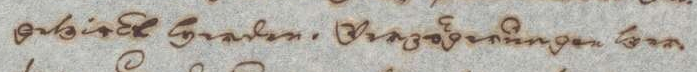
gewirkt werden. Verzögerungen wer-
